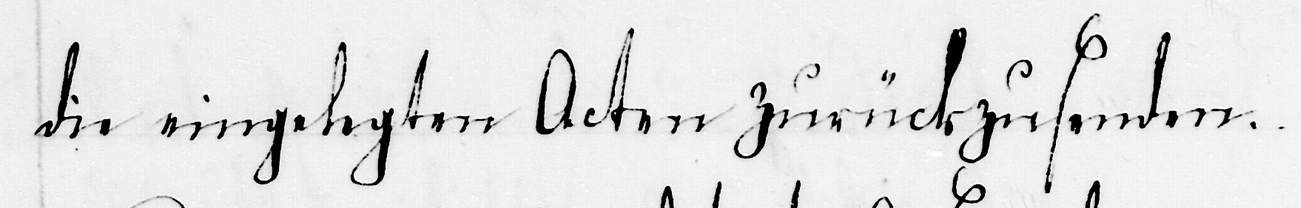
die eingelegten Acten zurückzusenden.
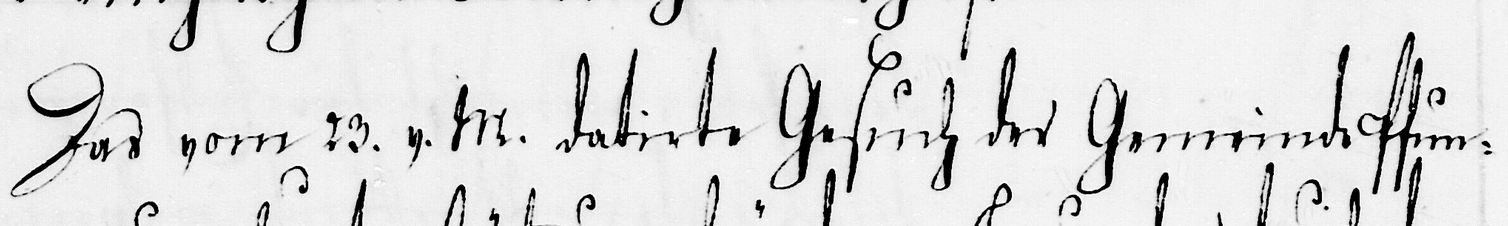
Das vom 23. v. M. datirte Gesuch der Gemeinde Pfun¬
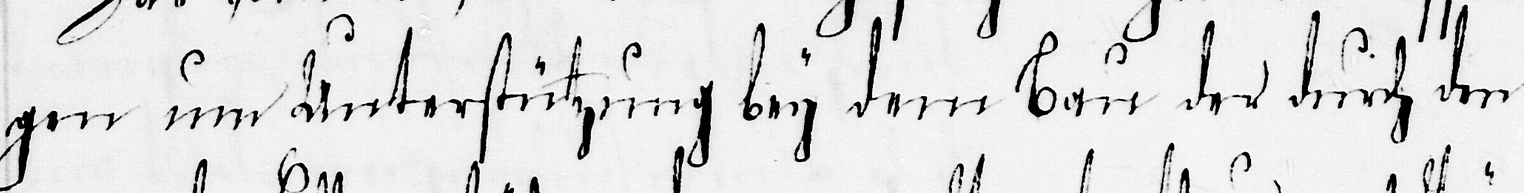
gen um Unterstützung bey dem Bau der durch den
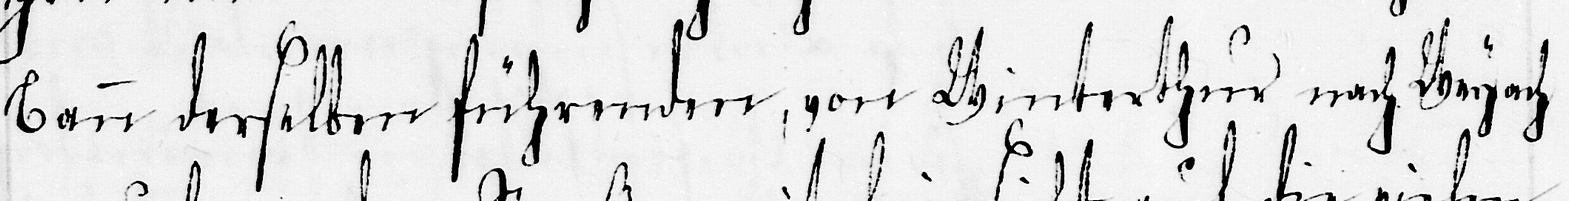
Bann derselben führenden, von Winterthur nach Weyach
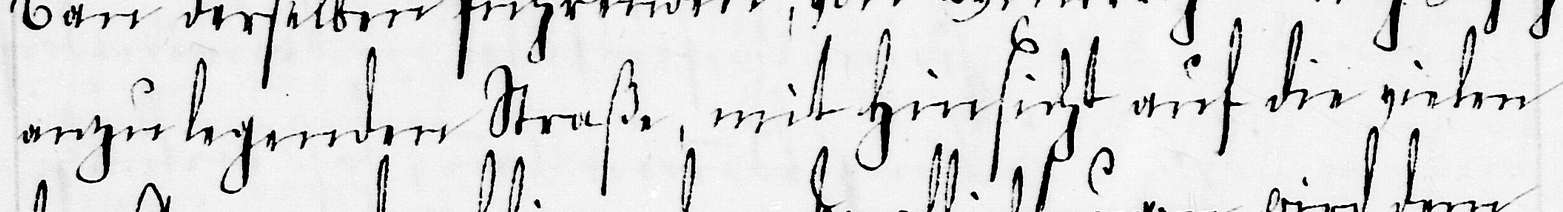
anzulegenden Straße, mit Hinsicht auf die vielen
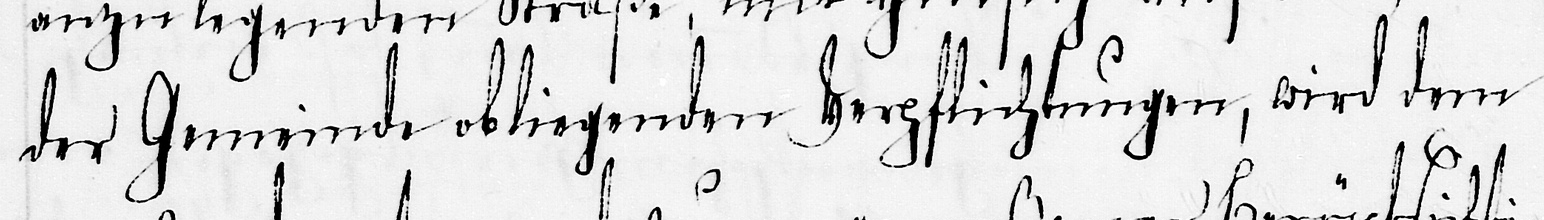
der Gemeinde obliegenden Verpflichtungen, wird dem
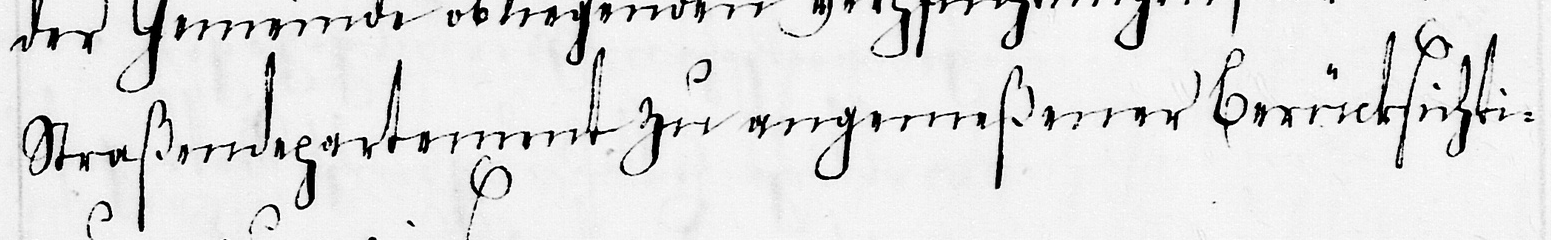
Straßendepartement zu angemeßener Berücksichti¬
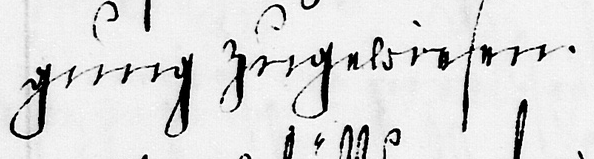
gung zugewiesen.
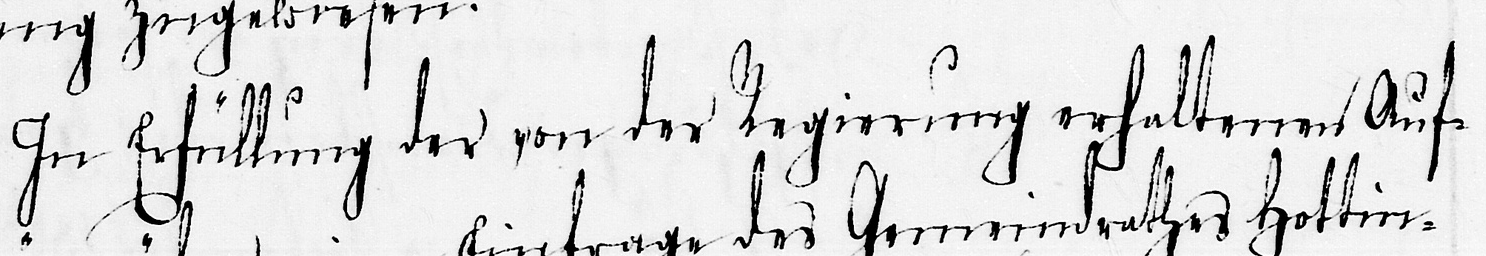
In Erfüllung der von der Regierung erhaltenen Auf¬
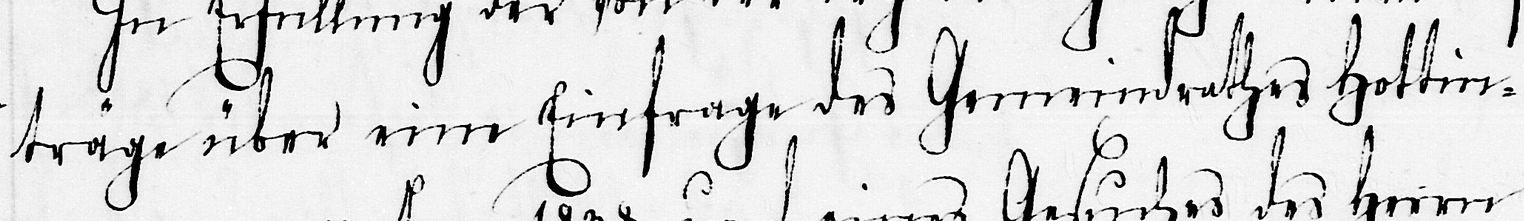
träge über eine Einfrage des Gemeindrathes Hottin¬
